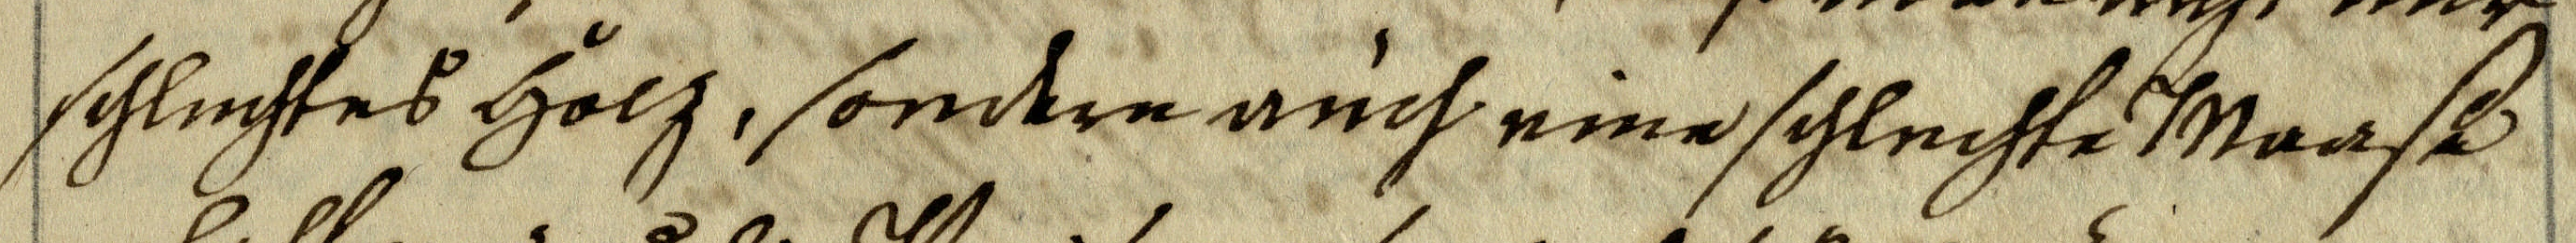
schlechtes Holz, sondern auch eine schlechte Maaße
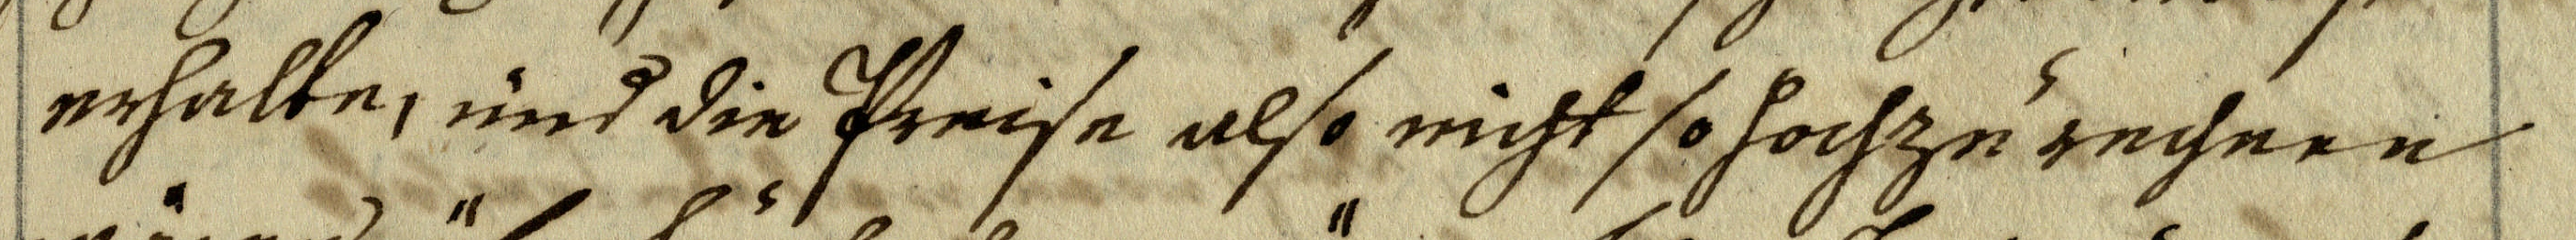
erhalte, und die Preise also nicht so hochzurechnen
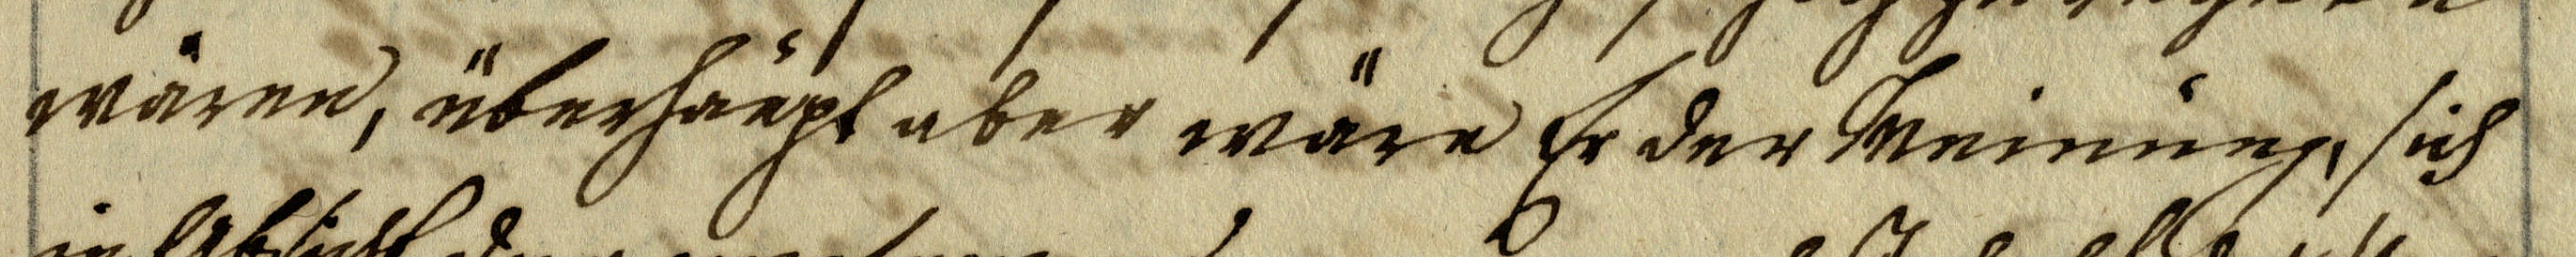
wären, überhaupt aber wäre Er der Meinung, sich
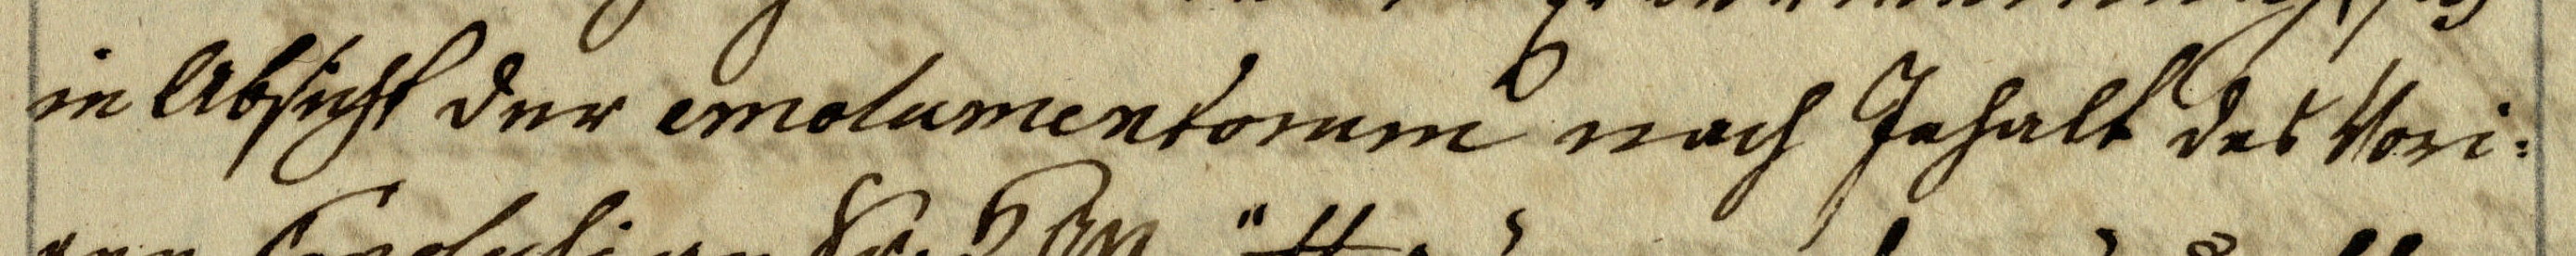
in Absicht der emolumentorum nach Inhalt des vori¬
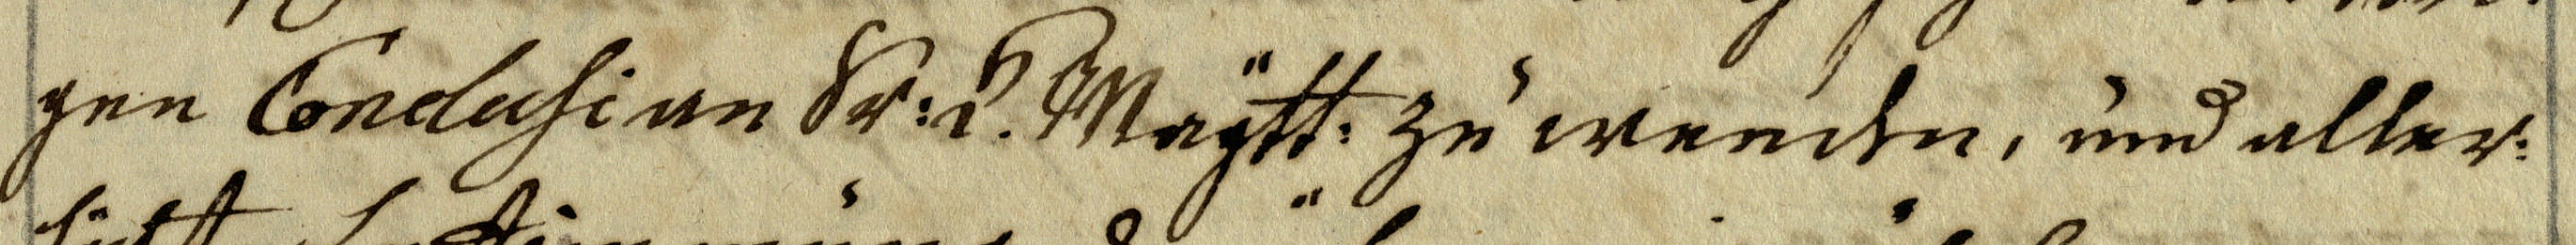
gen Conclusi an Sr. K. Maÿtt. zu wenden, und aller¬
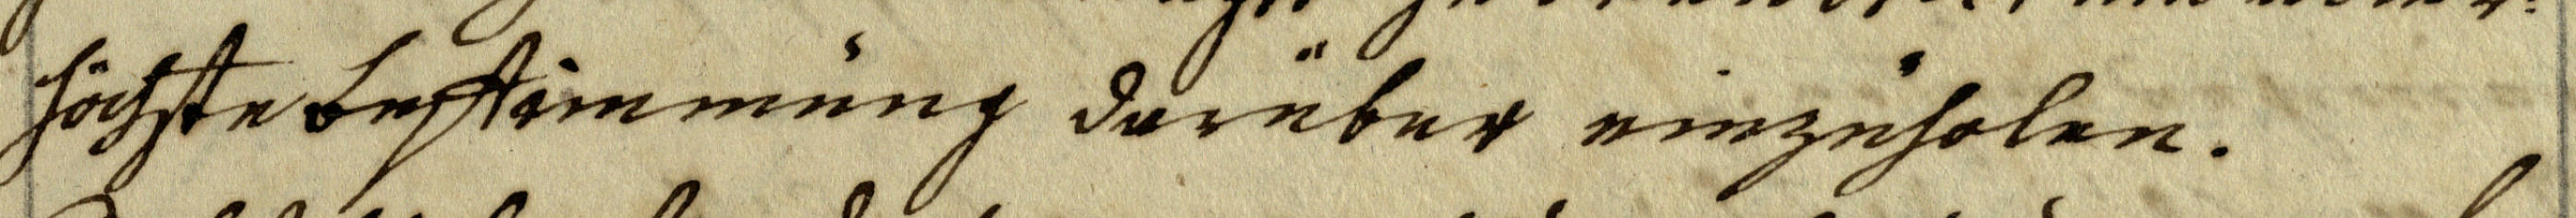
höchste Bestimmung darüber einzuholen.
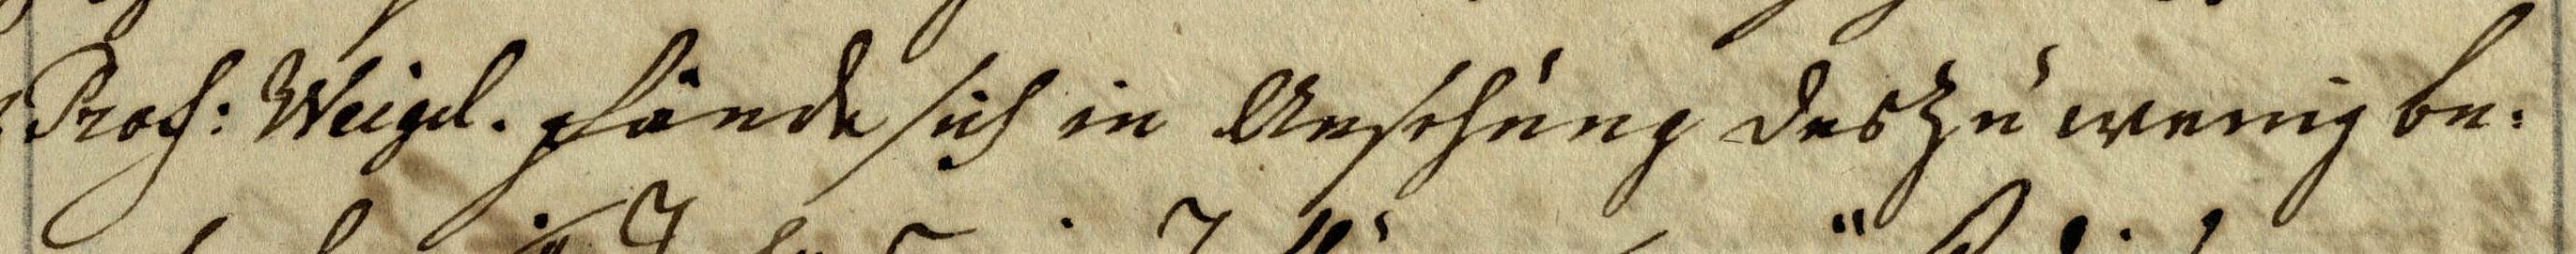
dh Prof. Weigel. fände sich in Ansehung des zu wenig be¬
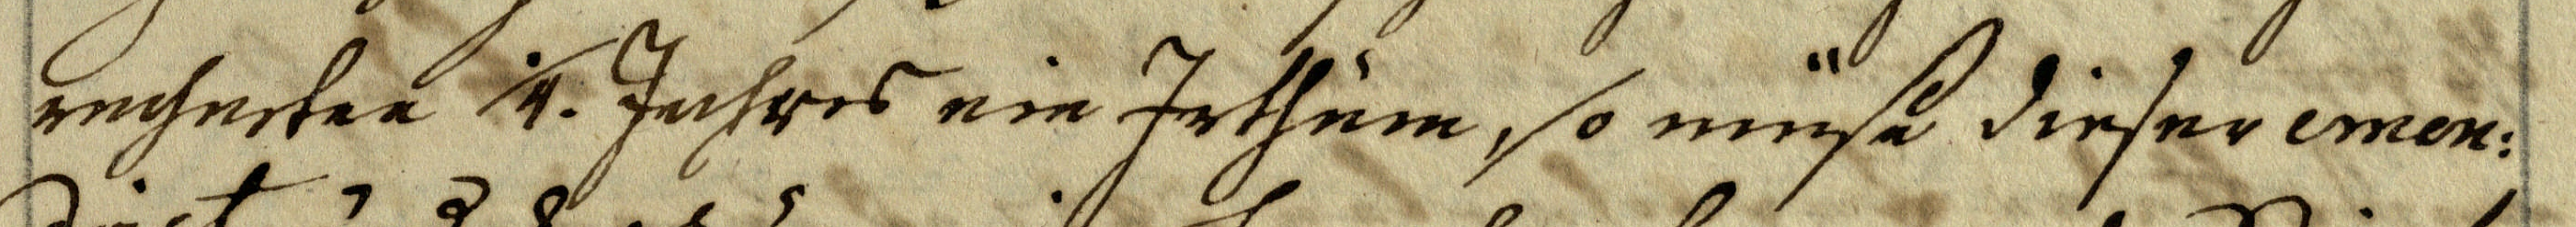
rechneten ¼ Jahres ein Irthum, so müße dieser emen¬
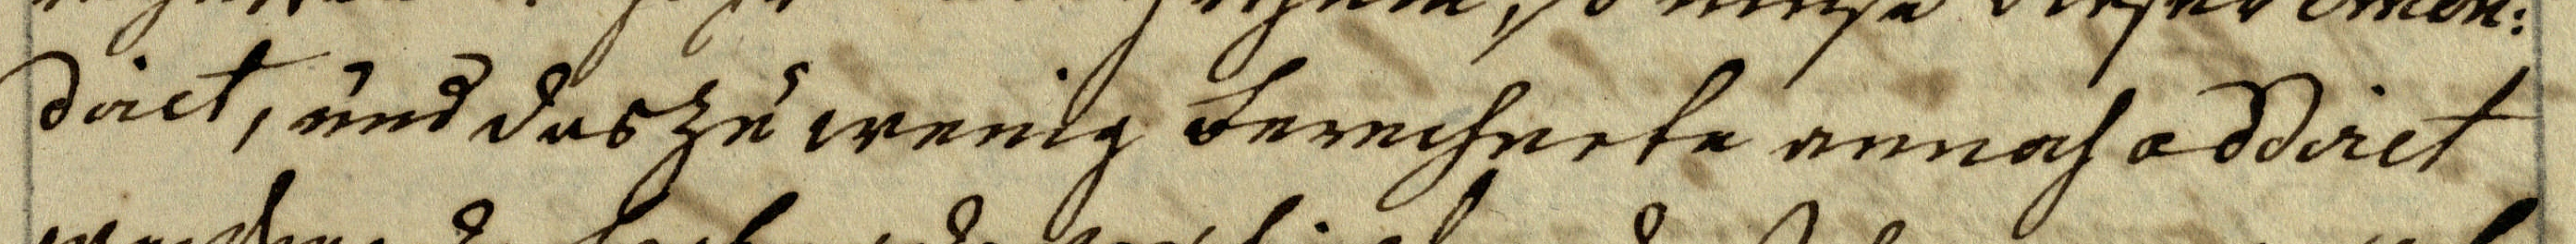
diret, und das zu wenig berechnete annoch addiret
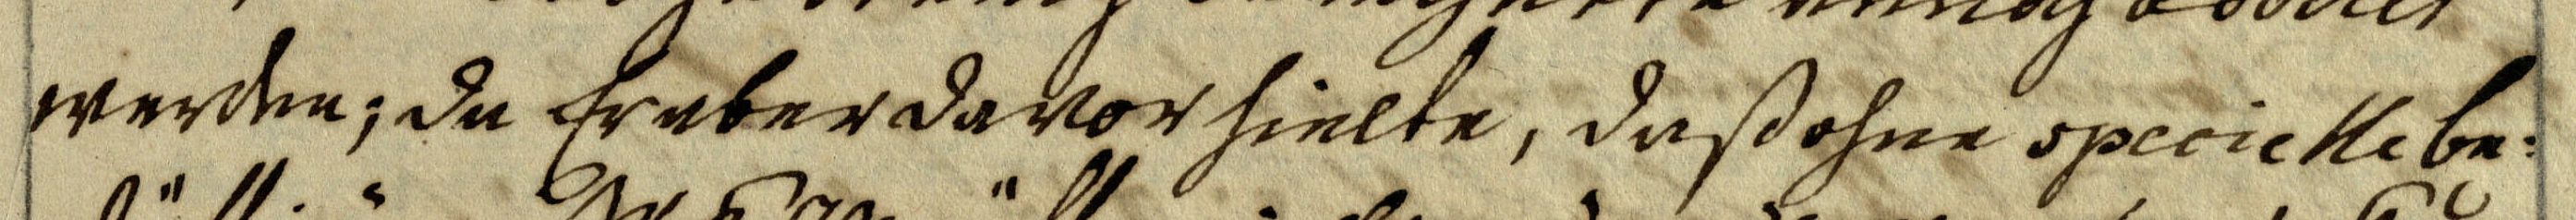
werden; da Er aber davor hielte, daß ohne specielle Be¬
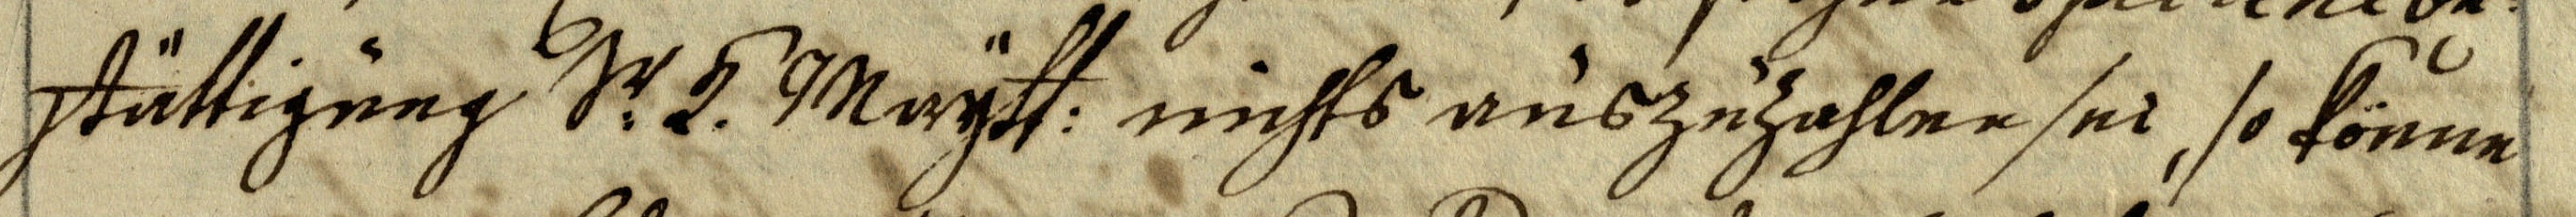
stättigung Sr. K. Maÿtt. nichts auszuzahlen sei, so könne
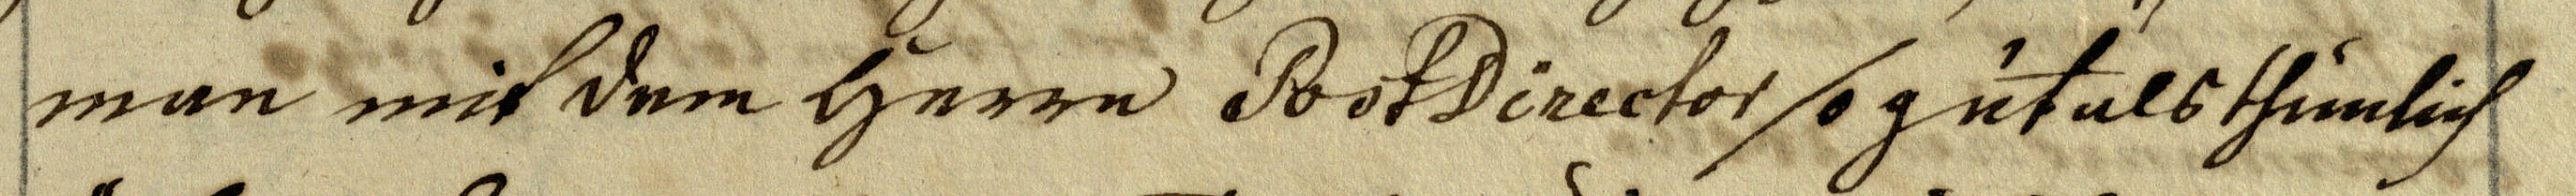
man mit dem Herrn PostDirector so gut als thunlich
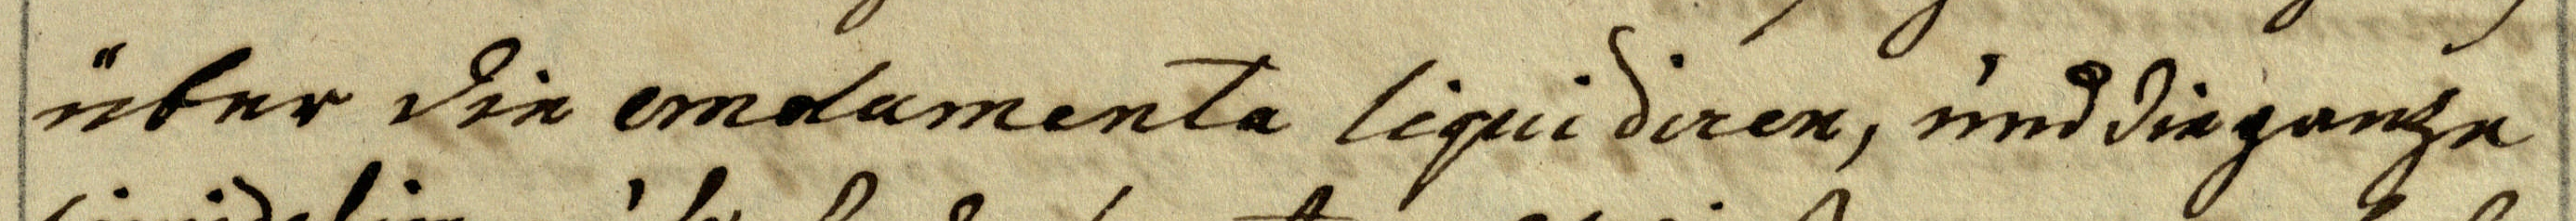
über die emolumente liquidiren, und die ganze
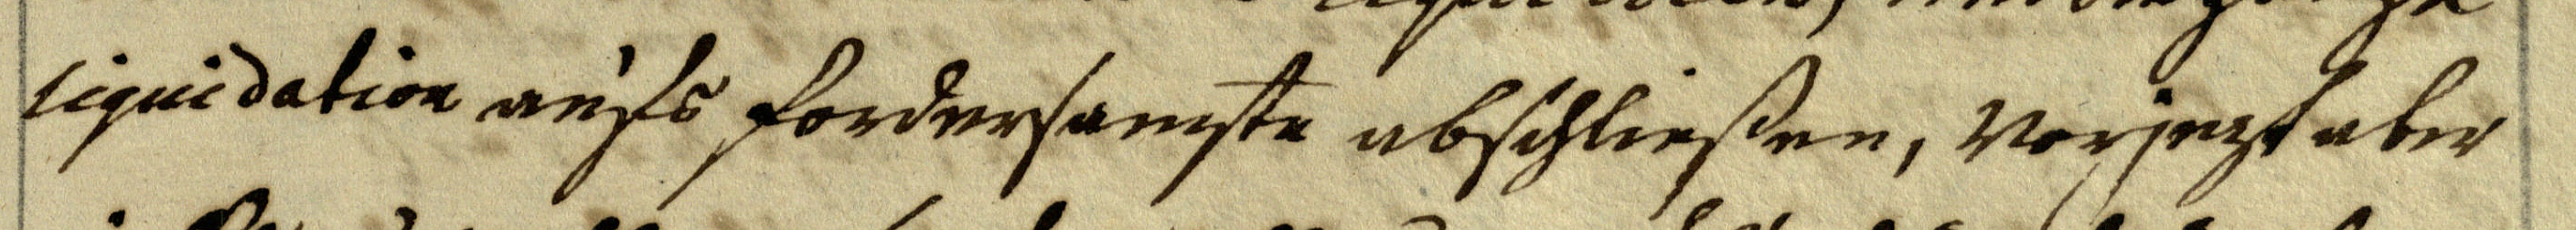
liquidation aufs fordersamste abschließen, vorjezt aber
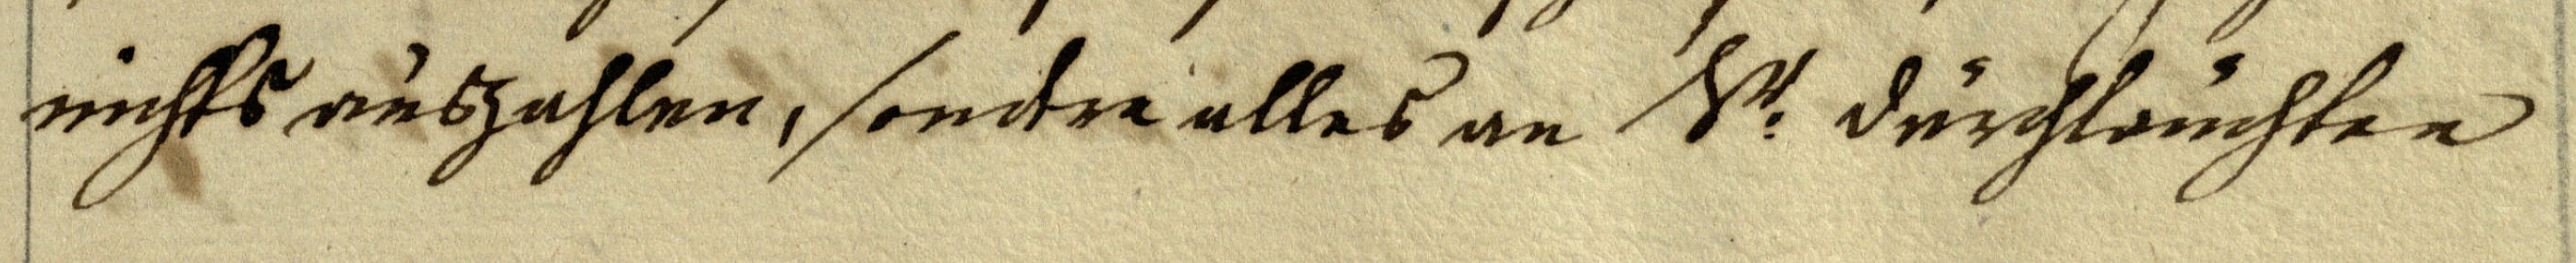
nichts auszahlen, sondern alles an Sr Durchlauchten
